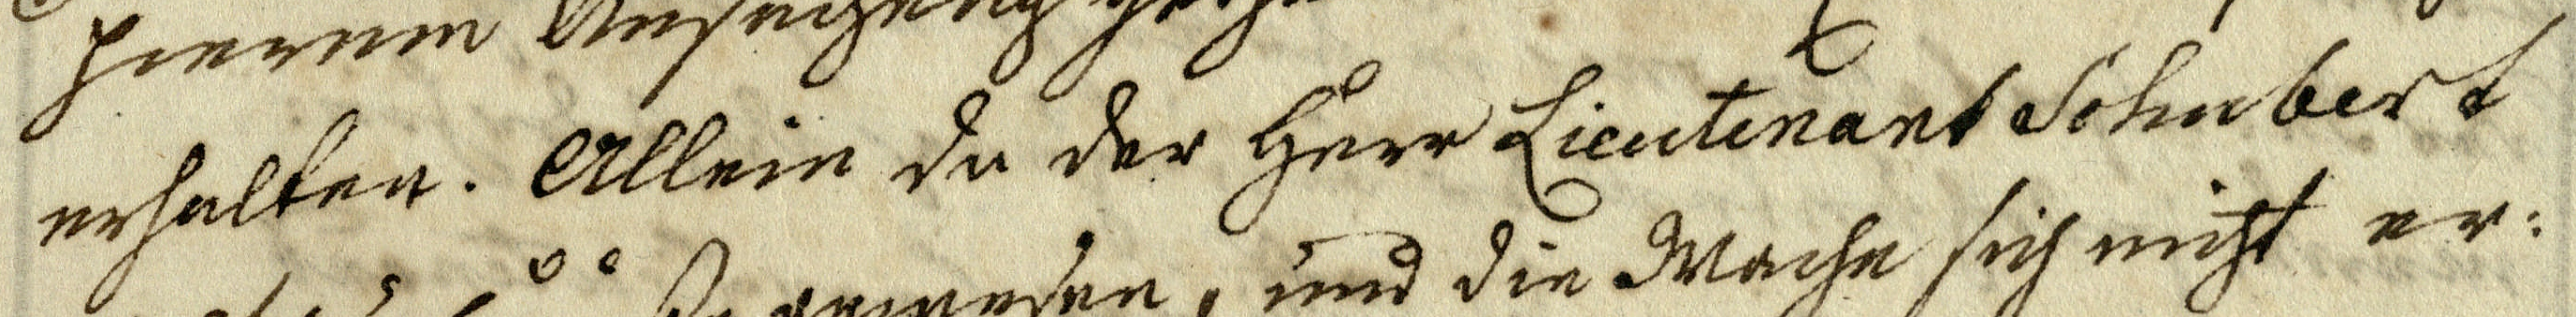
erhalten. Allein da der Herr Lieutenant Schubert
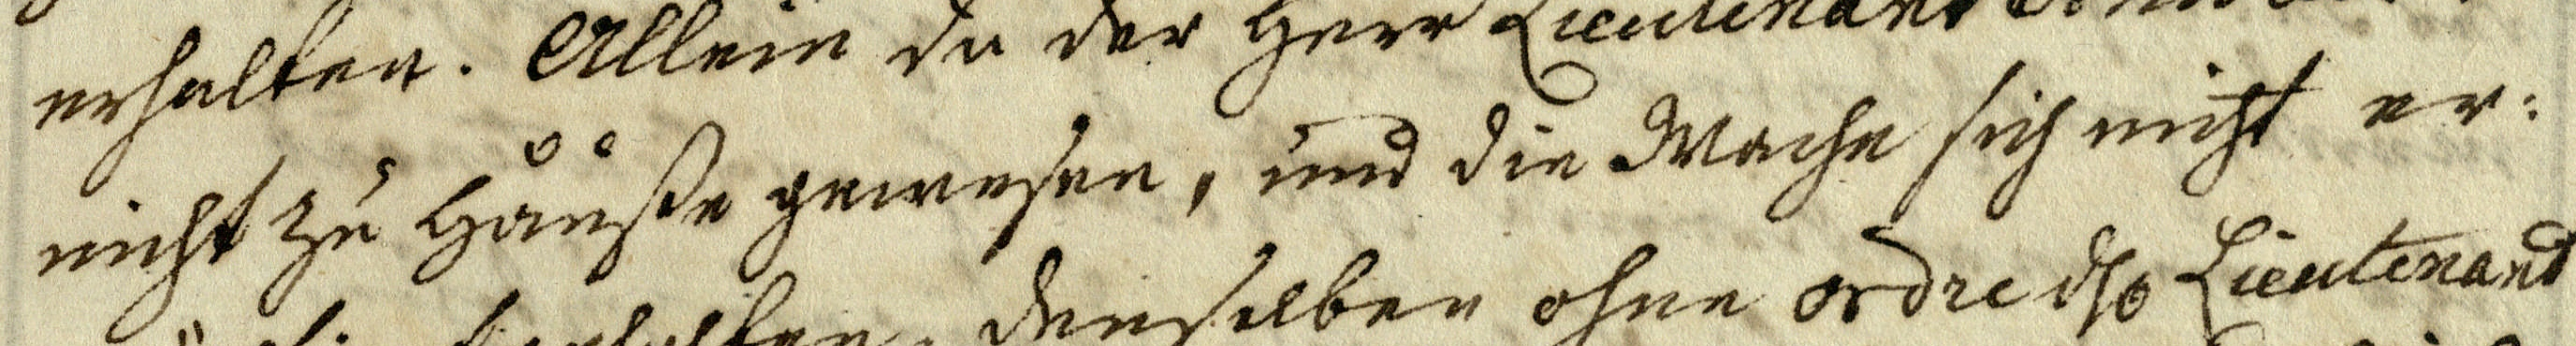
nicht zu Hauße gewesen, und die Wache sich nicht er¬
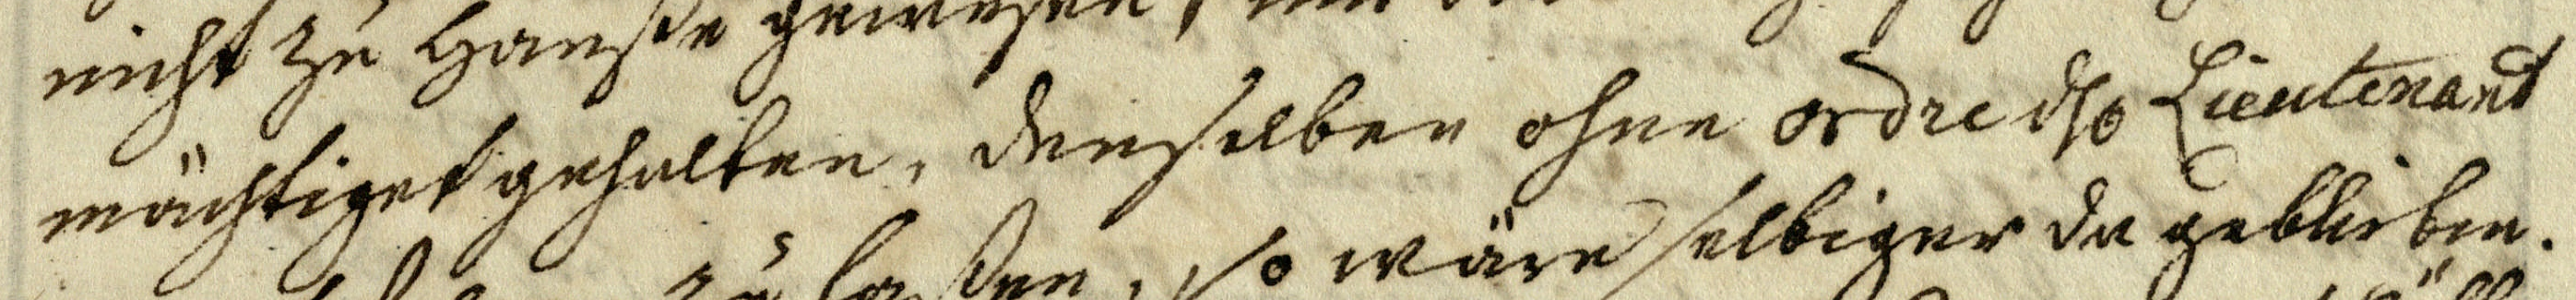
mächtiget gehalten, denselben ohne ordre dh Lieutenant
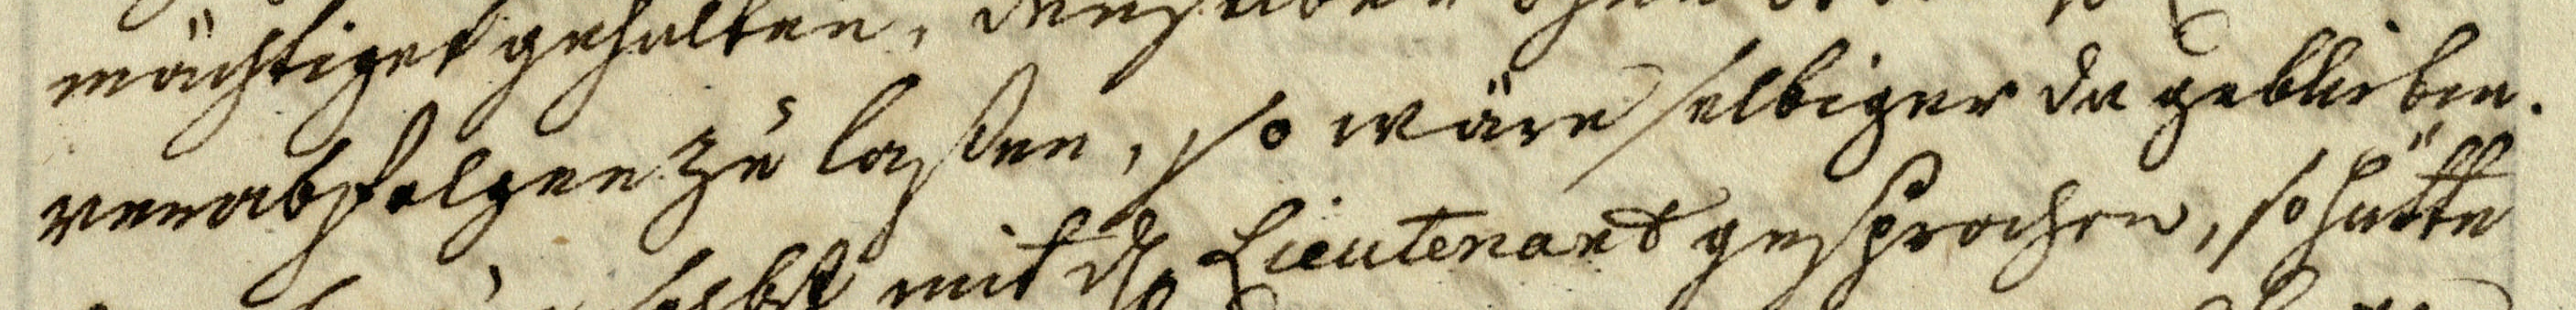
verabfolgen zu laßen, so wäre selbiger da geblieben.
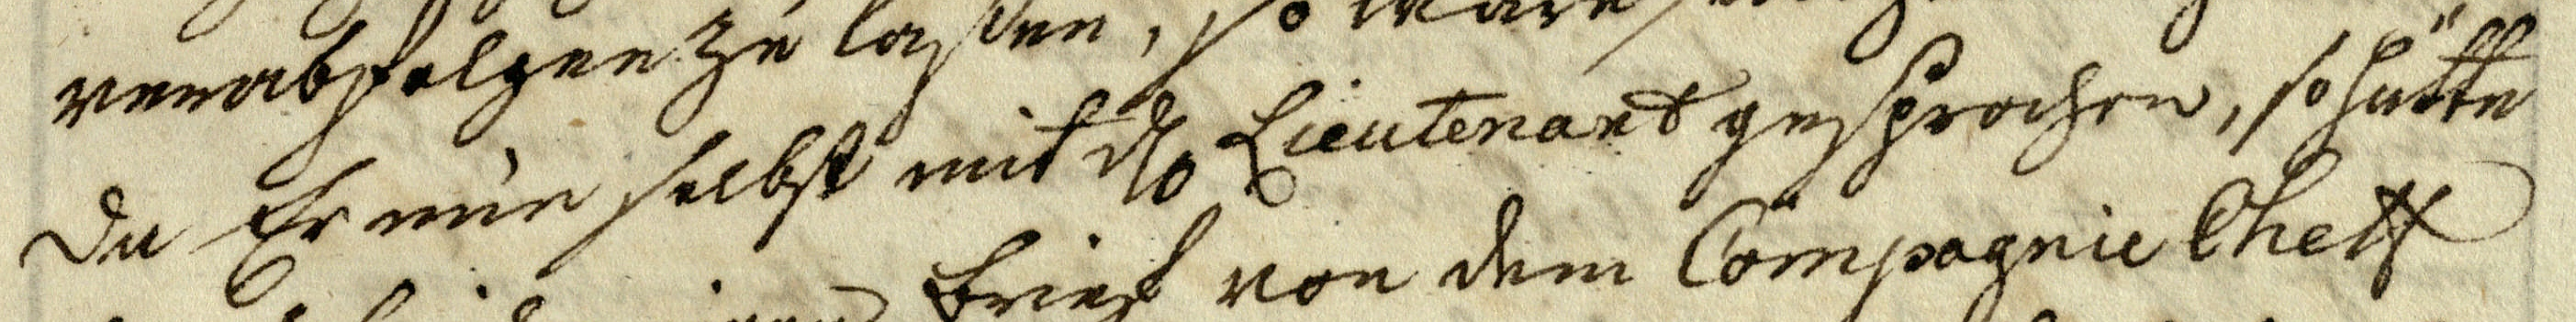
Da Er nun selbst mit dh Lieutenant gesprochen, so hätte
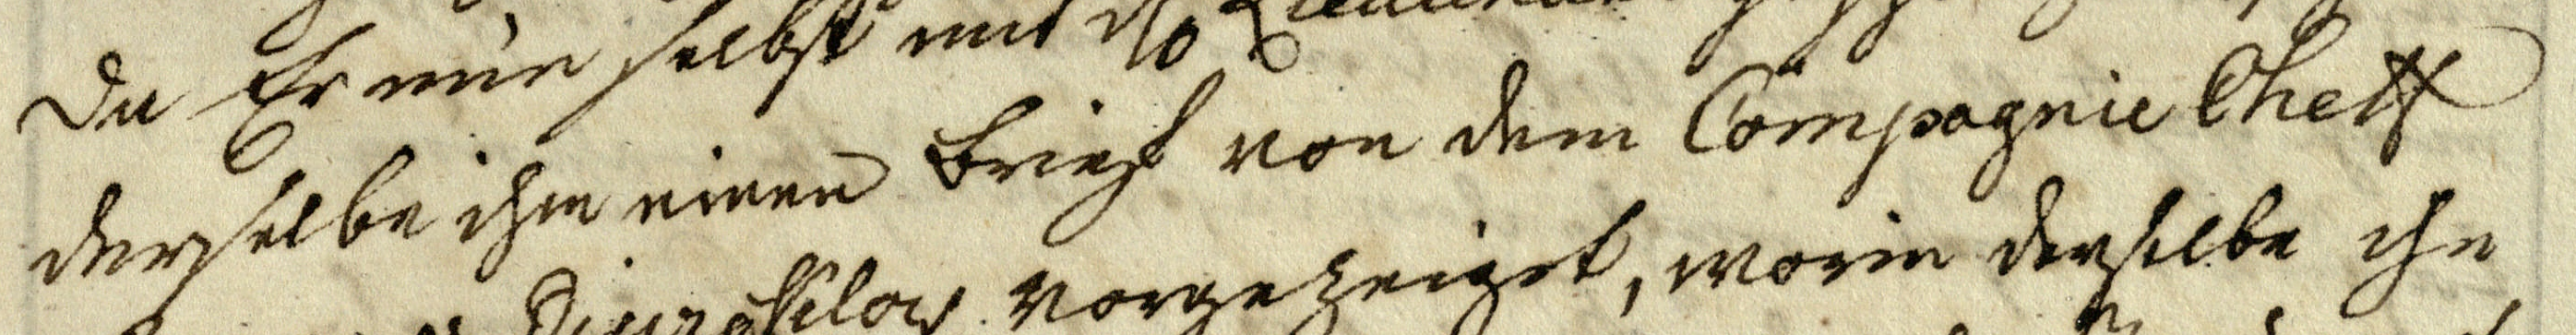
derselbe ihm einen Brief von dem Compagniecheff
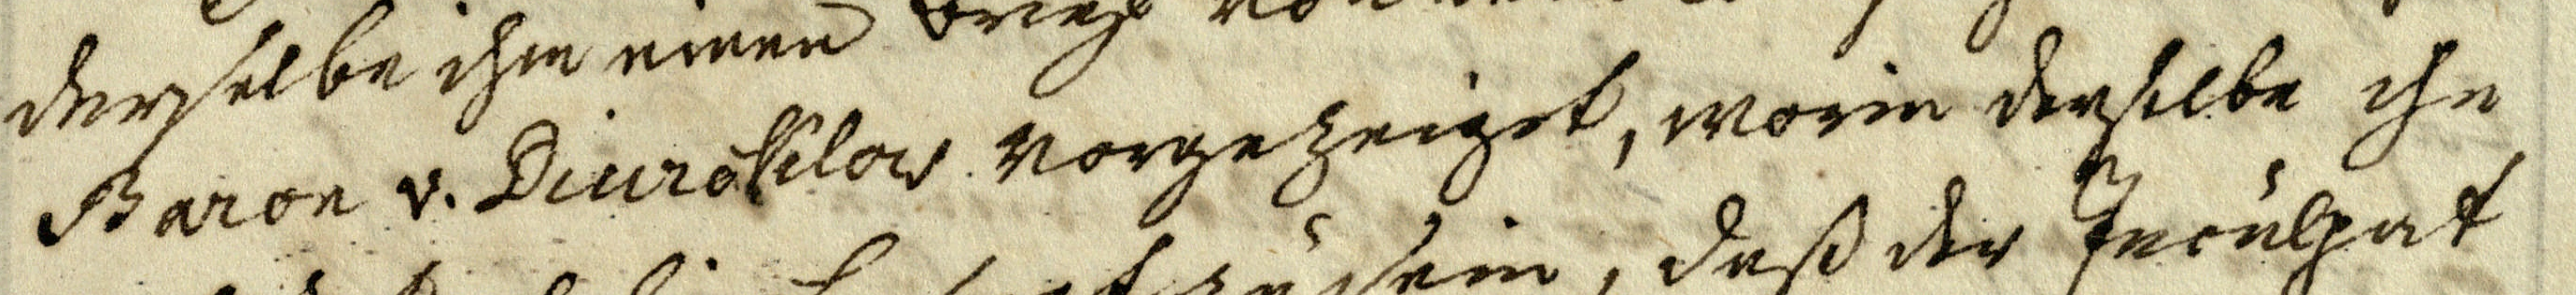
Baron v. Diurcklow vorgezeiget, worin derselbe ihn
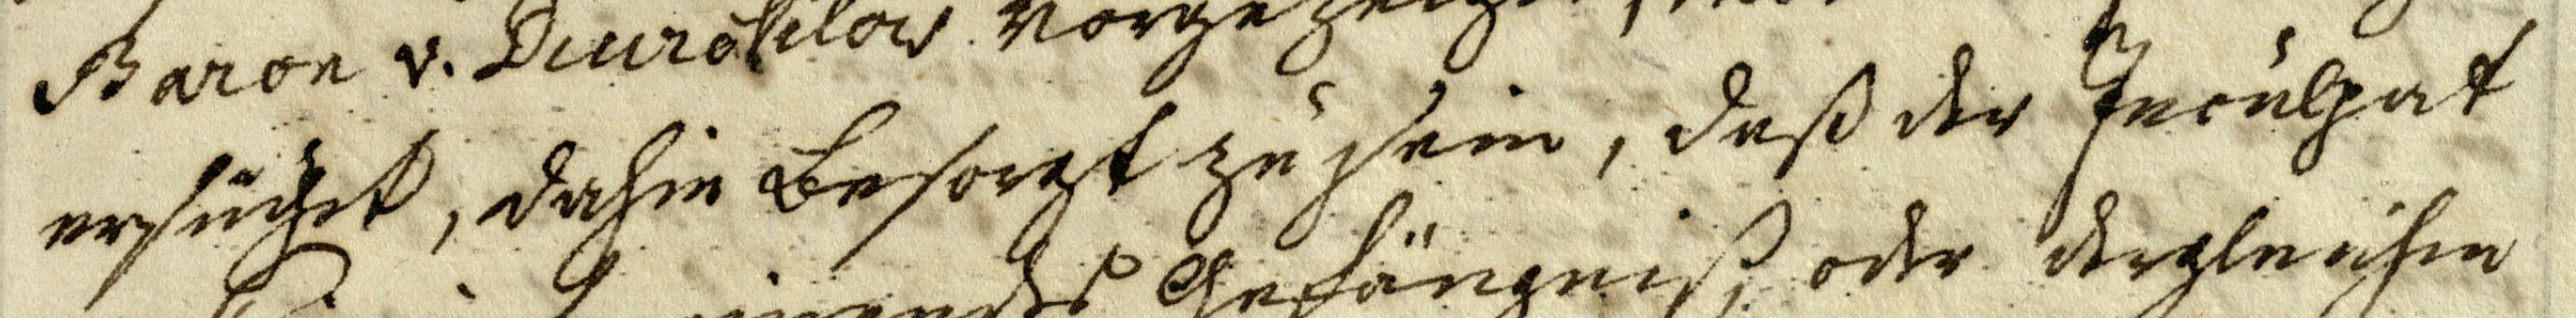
ersuchet, dahin besorgt zu sein, daß der Inculpat
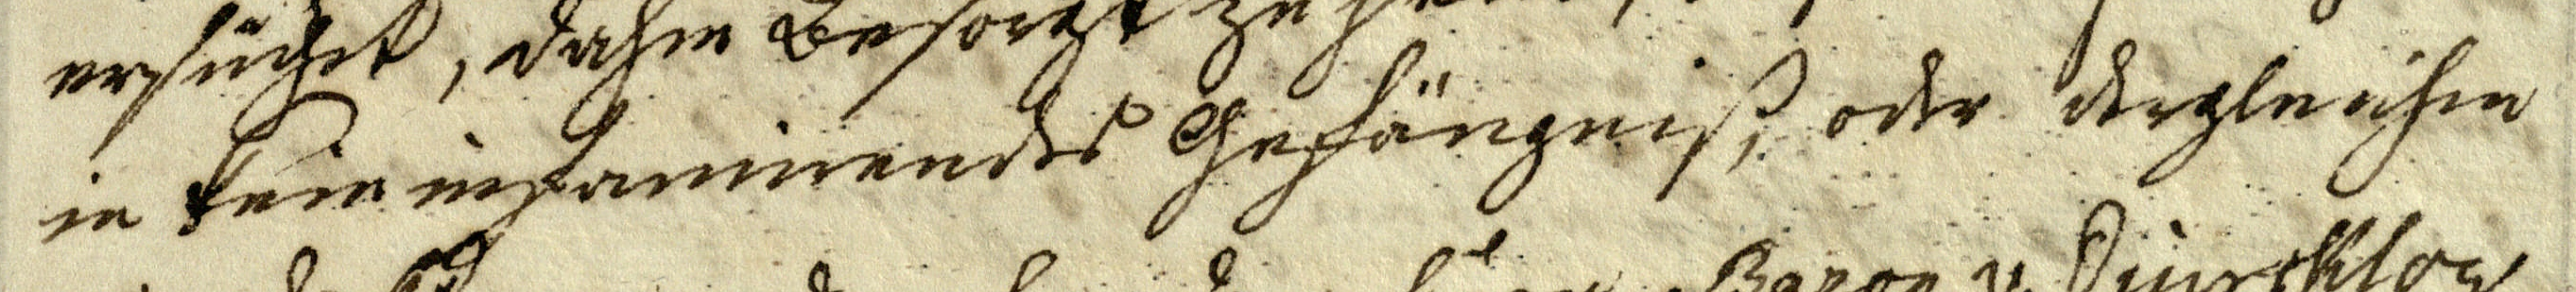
in kein infamirendes Gefängniß, oder dergleichen
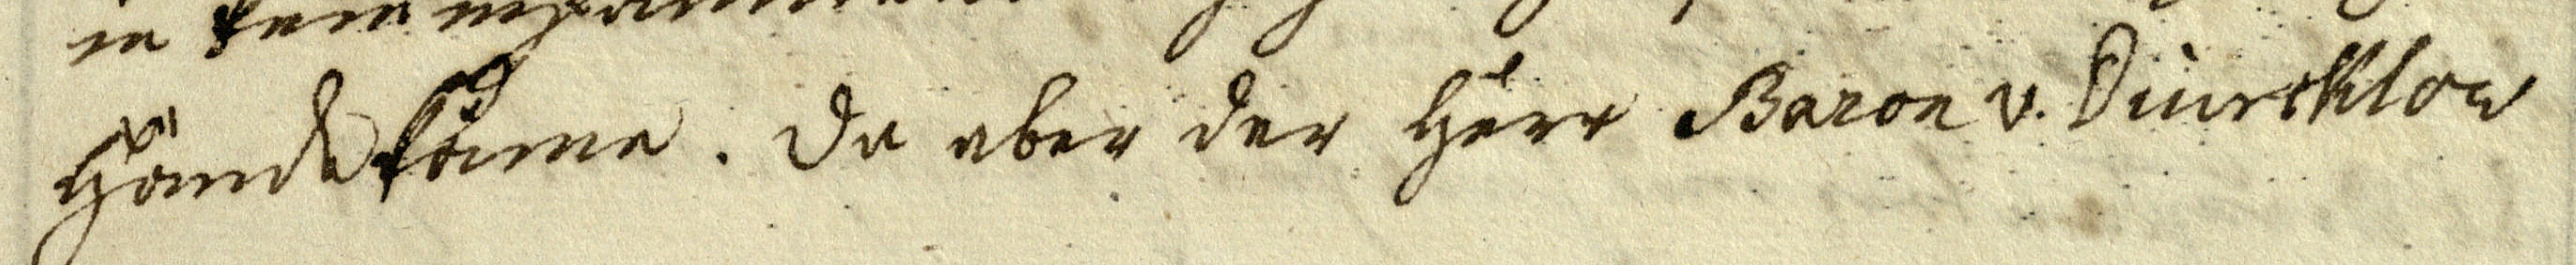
Hände käme. Da aber der Herr Baron v. Diurcklow
